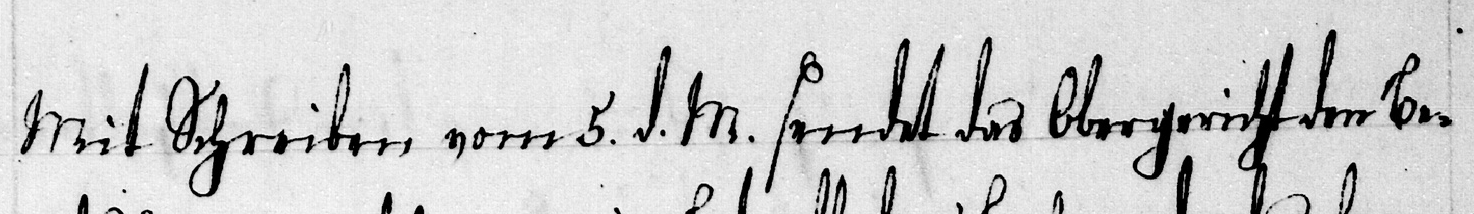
Mit Schreiben vom 5. d. M. sendet das Obergericht den Be¬
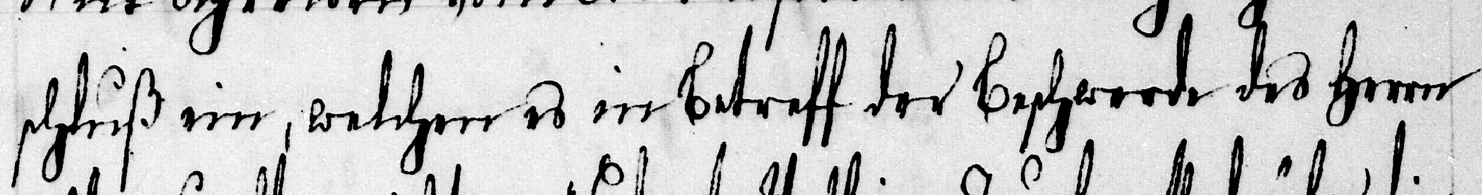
schluß ein, welchen es in Betreff der Beschwerde des Herrn
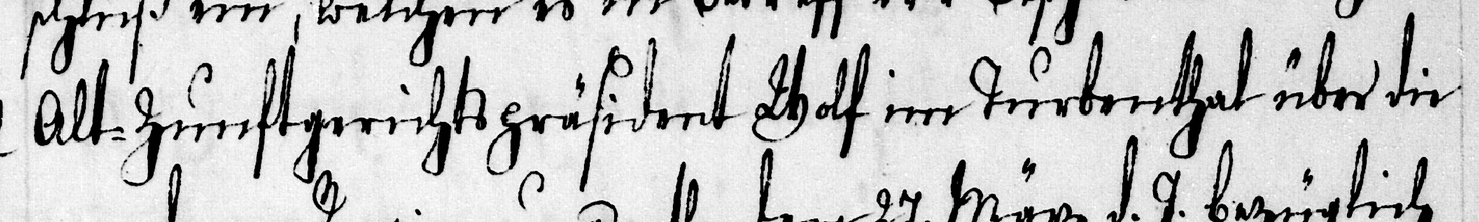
Alt-Zunftgerichtspräsidenten Wolf im Turbenthal über die
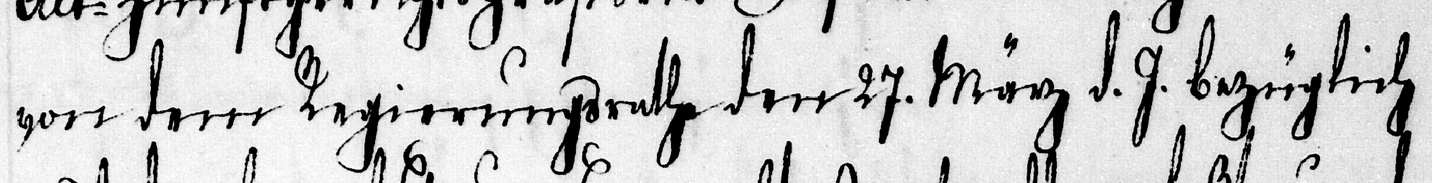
von dem Regierungsrathe den 27. März d. J. bezüglich
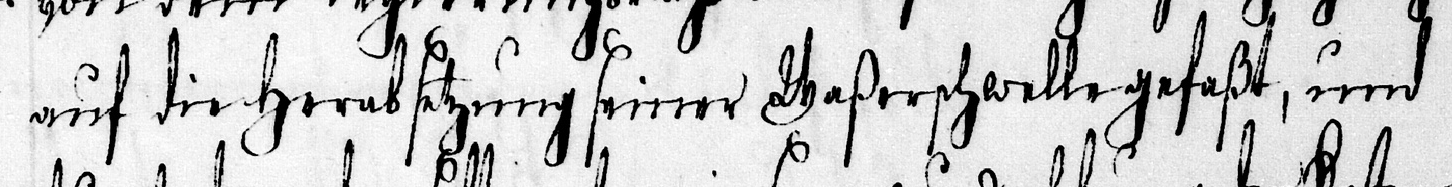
auf die Herabsetzung seiner Waßerschwelle gefaßt, und
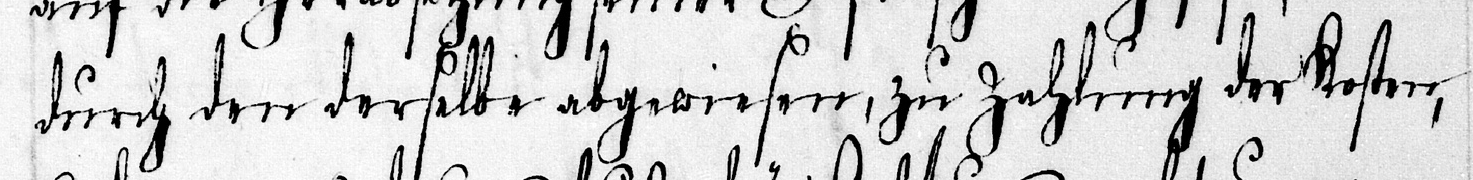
durch den derselbe abgewiesen, zu Zahlung der Kosten,
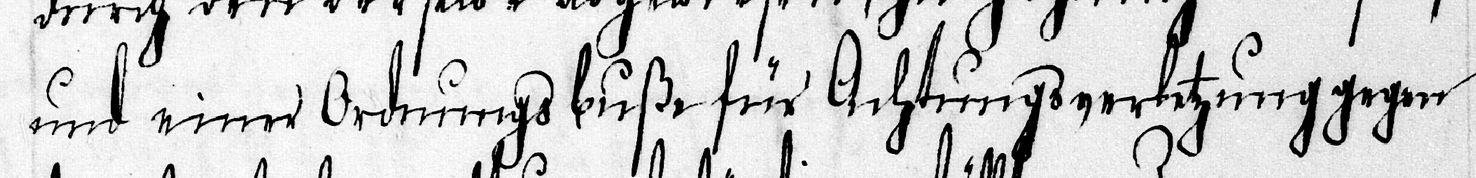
und einer Ordnungsbuße für Achtungsverletzung gegen
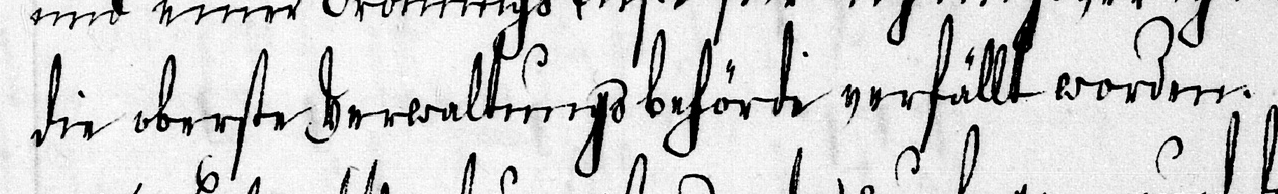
die oberste Verwaltungsbehörde verfällt worden.
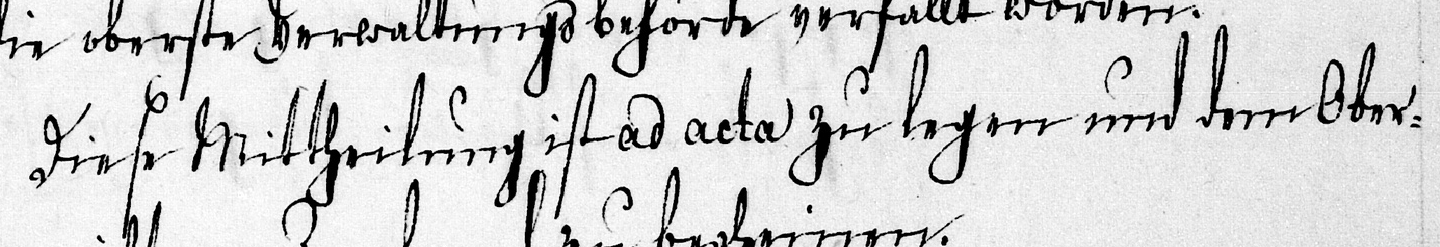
Diese Mittheilung ist ad acta zu legen und dem Ober¬
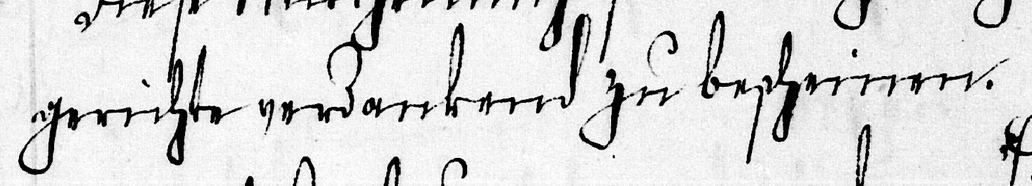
gerichte verdankend zu bescheinen.
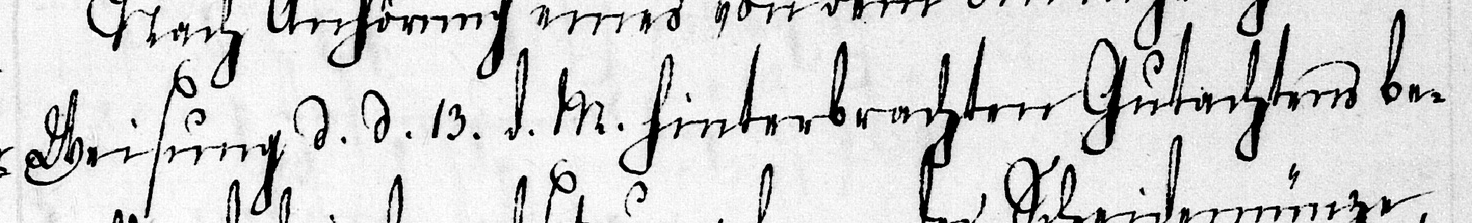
Weisung d. d. 13. d. M. hinterbrachten Gutachtens be¬
